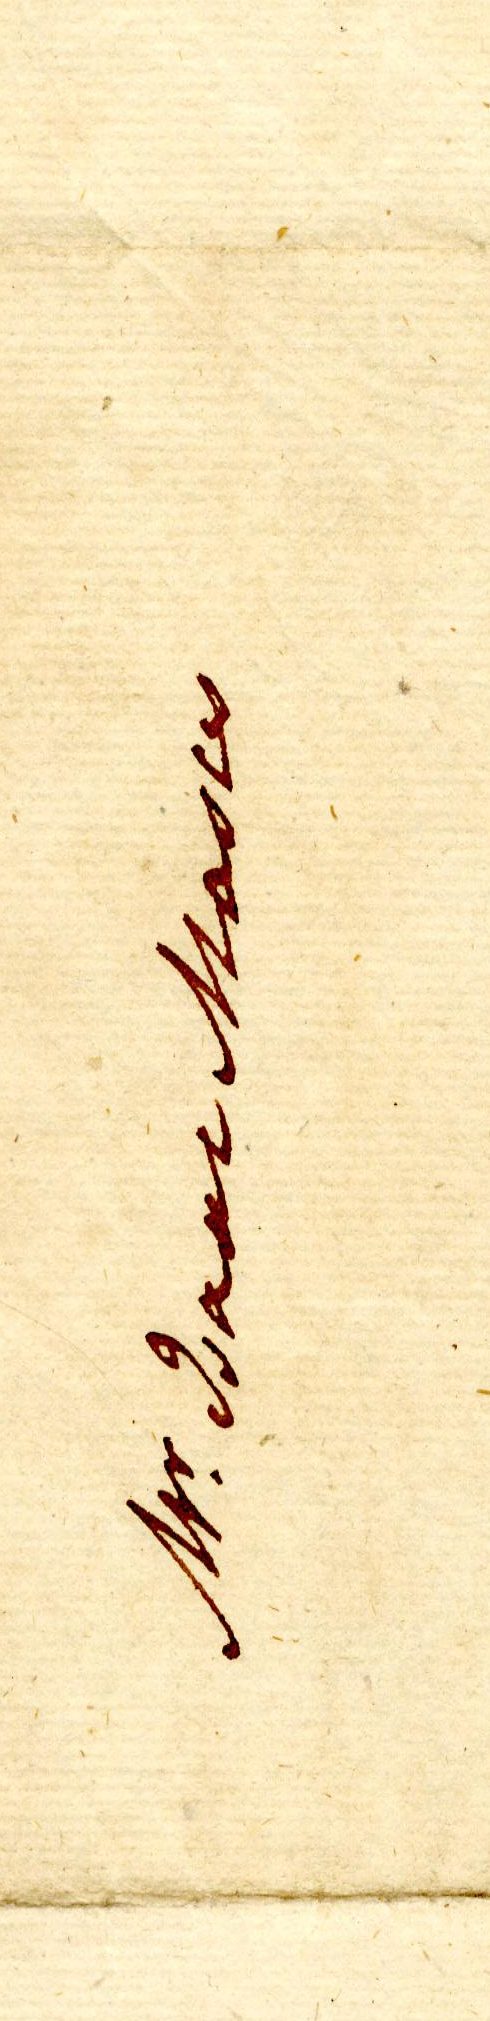M^r Isaac Moses
